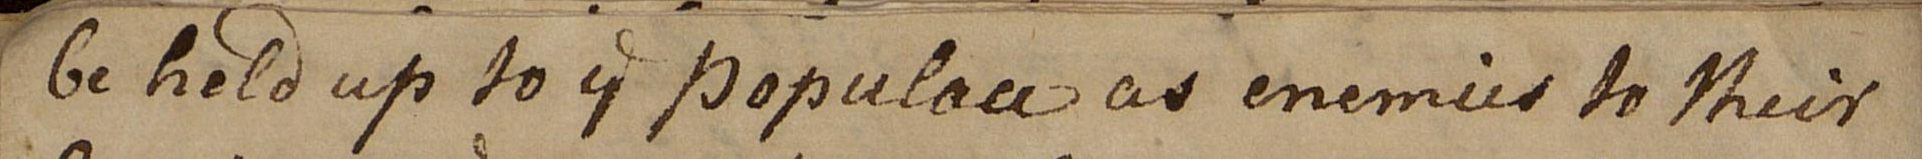be held up to y^e Populace as enemies to their
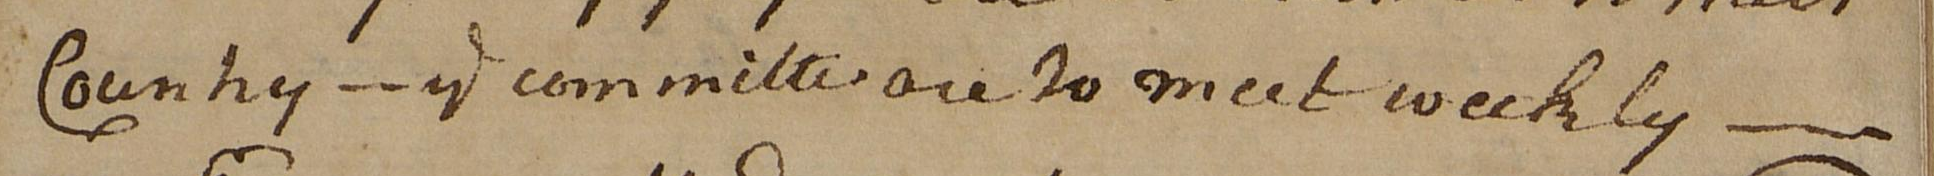Country- y^e committe are to meet weekly-
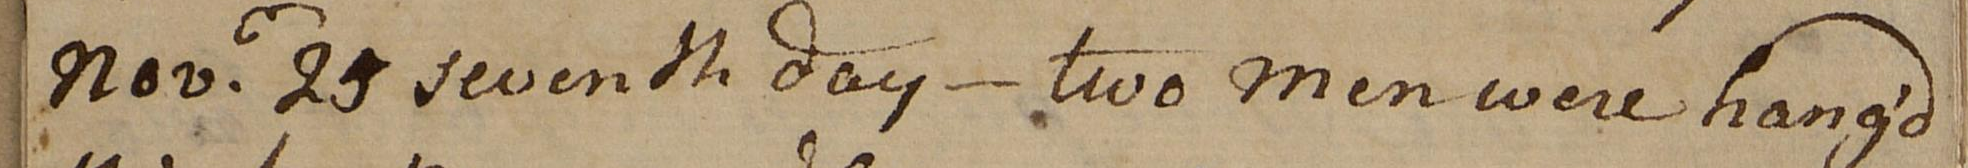nov.^r 25 seventh day- two men were hang'd
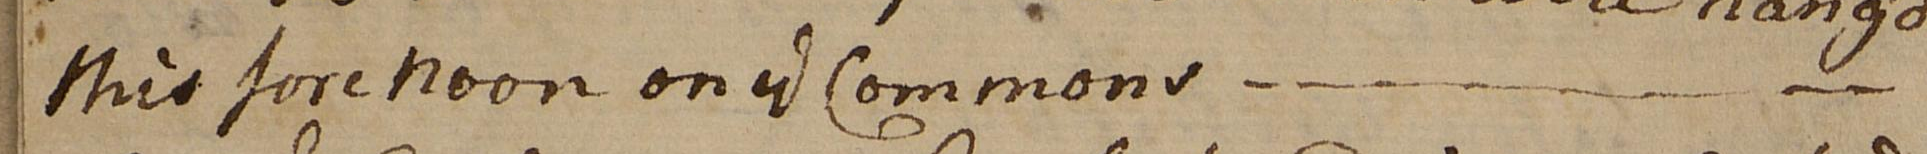this forenoon on y^e Commons----
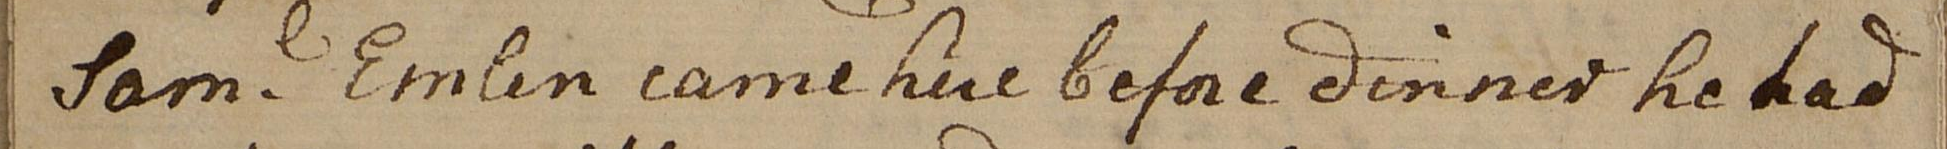Sam^l. Emlen came here before dinner he had
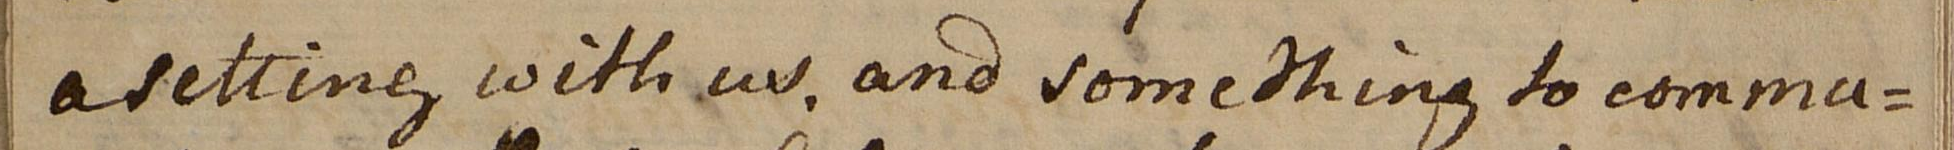a setting with us, and something to commu-
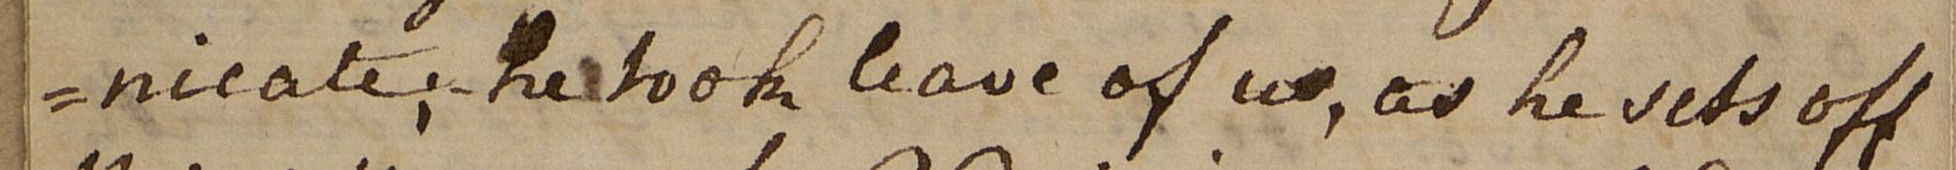-nicate; he took leave of us, as he sets off
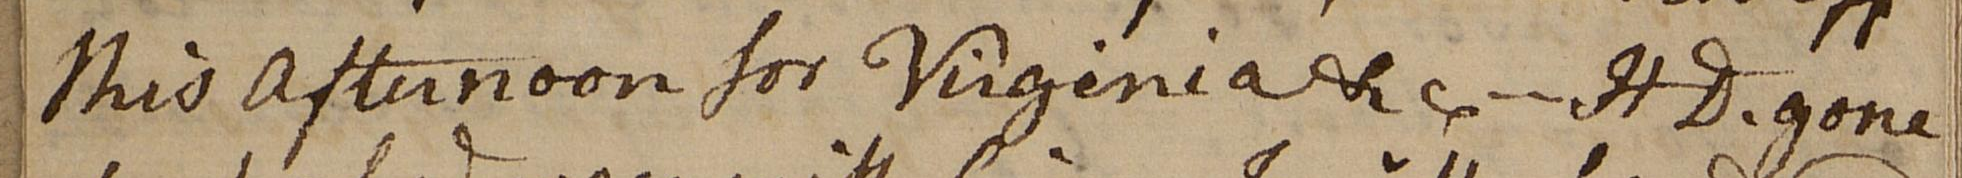this Afternoon for Virginia &c-- HD gone
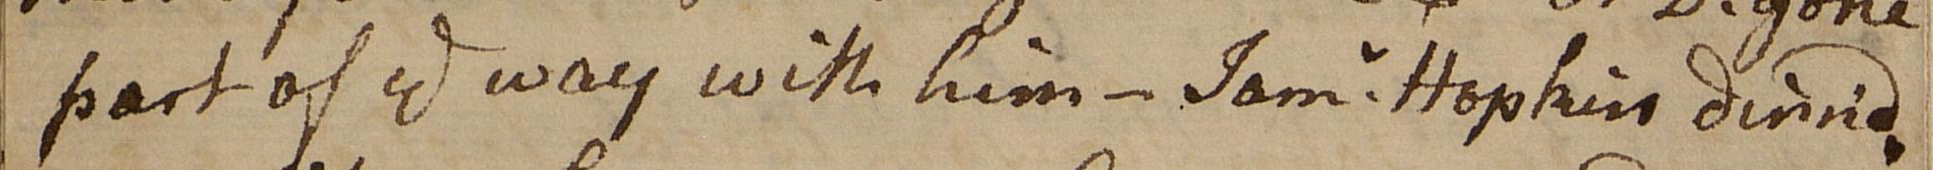part of y^e way with him- Jam.^s Hopkin dinn'd
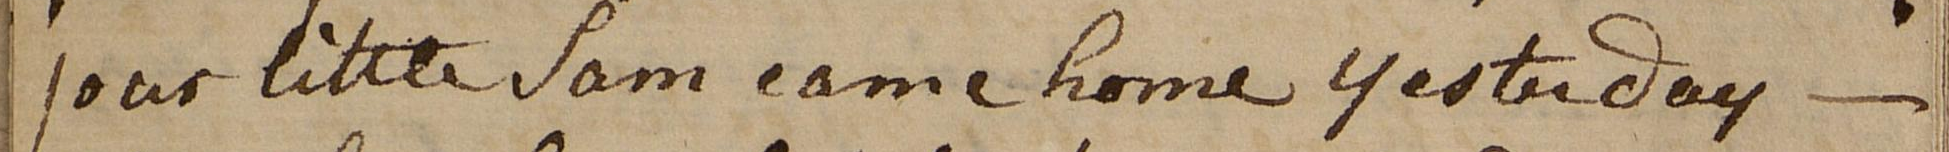/our little Sam came home Yesterday-
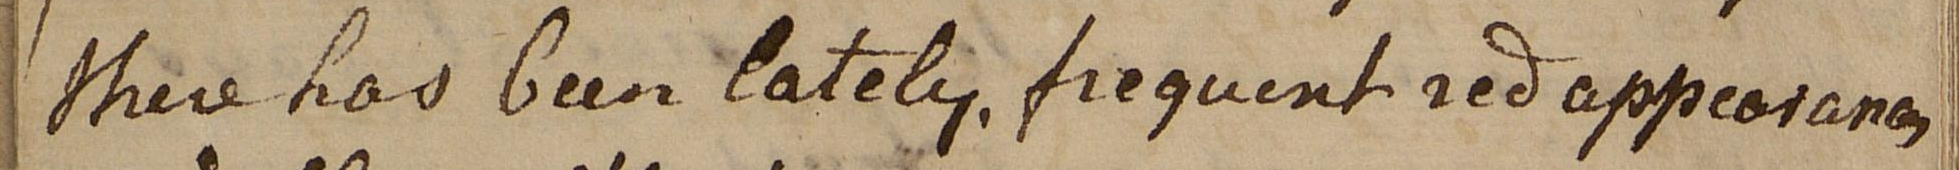there has been lately, frequent red appearances
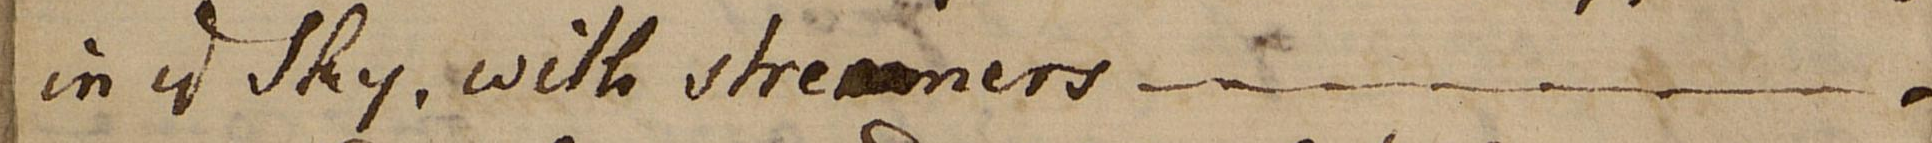in y^e Sky, with streamers--
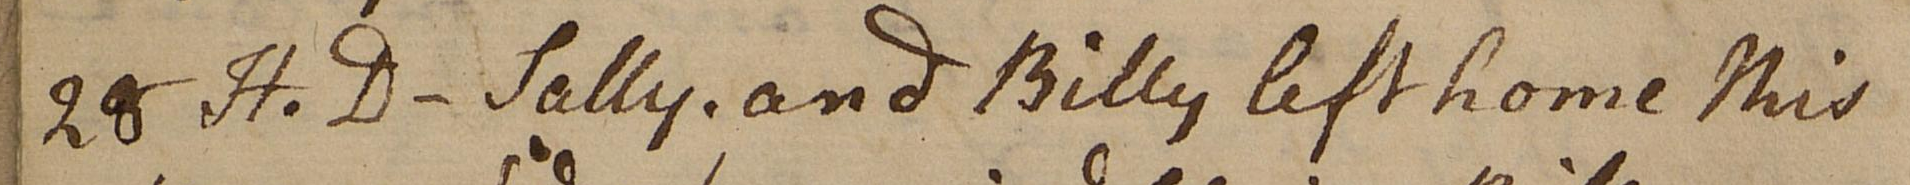28 H.D- Sally. and Billy left home this
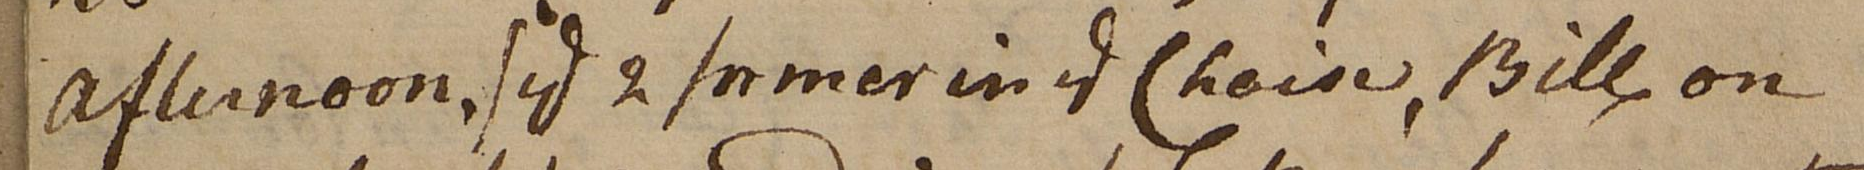Afternoon, /y^e 2 former in y^e Chaise, Bill on
